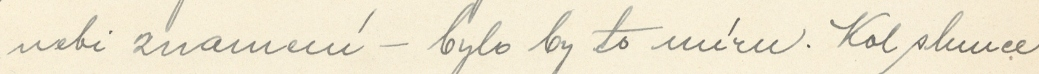nebi znamení - bylo by to míru. Kol slunce
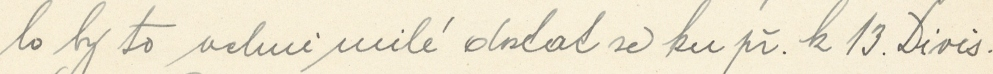lo by to velmi milé dostat se ku př. k 13. Divis.
